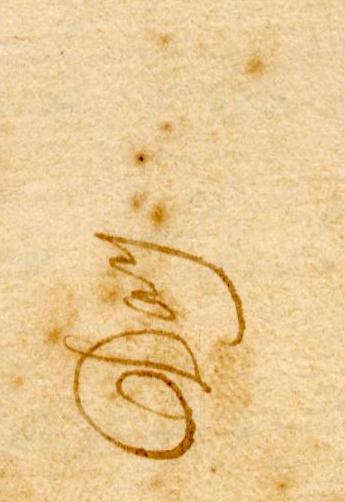Day
